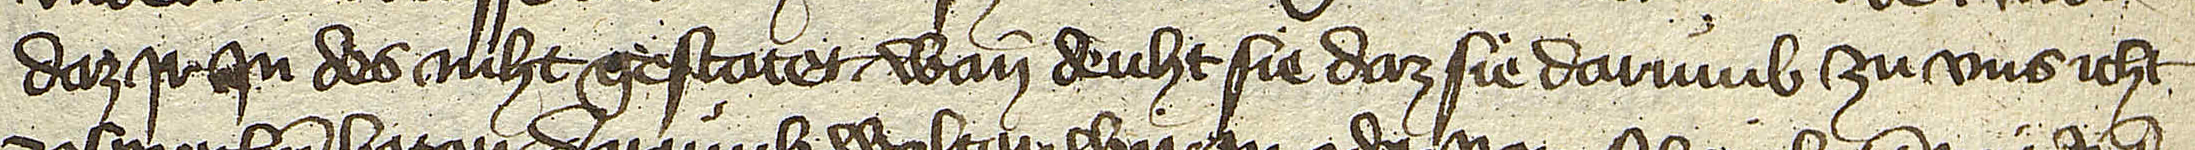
daʒ Ir In des niht geſtatet / wan* deuht ſie daʒ ſie darumb cʒu vns icht
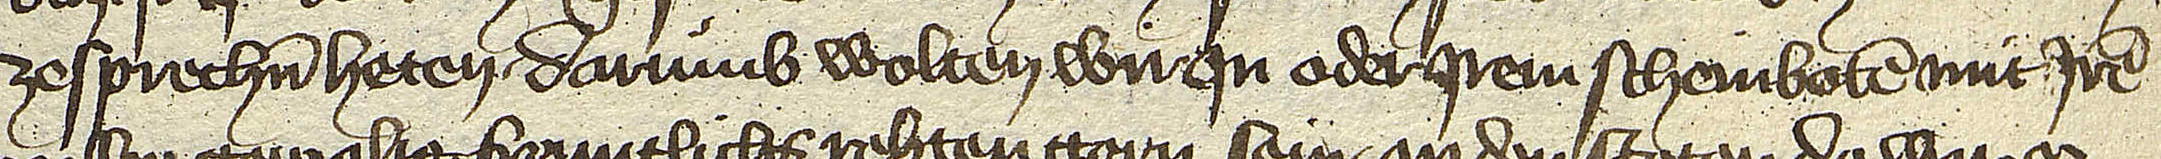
ʒeſprechn* heten / darümb wolten wir In oder Irem ſcheinbote* mit Ire*
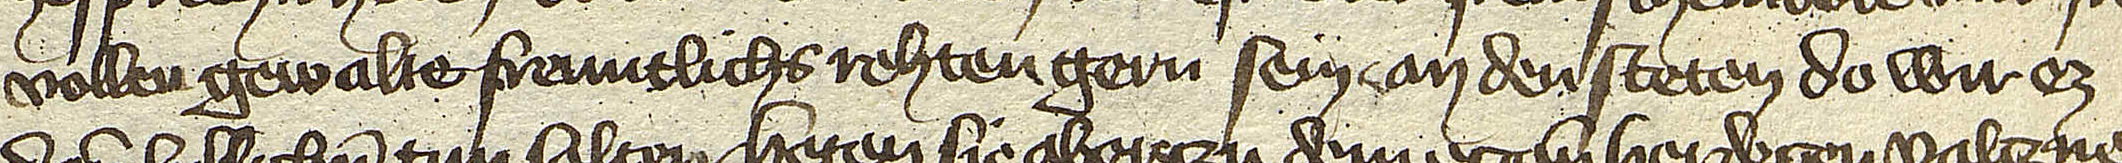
vollen gewalte freuntlichs rehten gern ſein / an den ſteten do wir eʒ
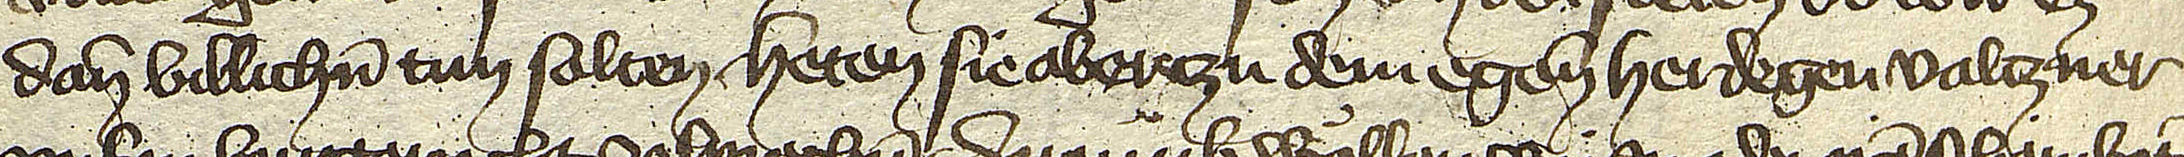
dan* billichn* tun ſolten / heten ſie aber cʒu dem egen* herdegen valcʒner
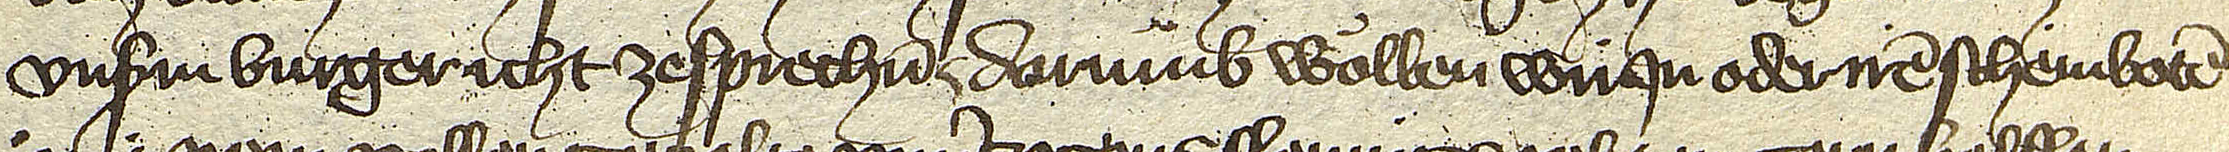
vnſ*m burger icht cʒeſprechn* darümb wöllen wir In oder ire* ſcheimbote*
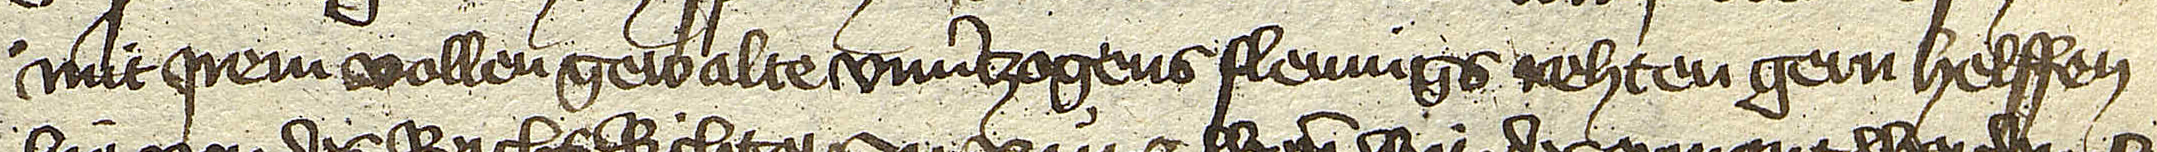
mit Irem vollen gewalte vnu*cʒogens ſlewnigs rehten gern helffen
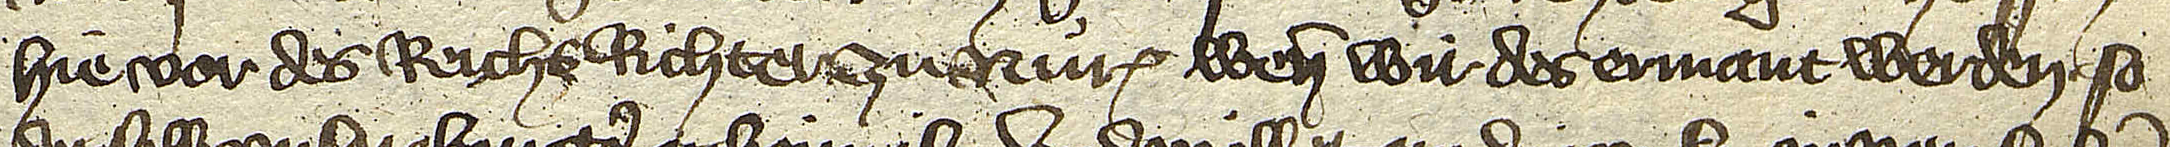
hie vor des Reichs Richter cʒu Nür* wen* wir des ermant werden / ſo
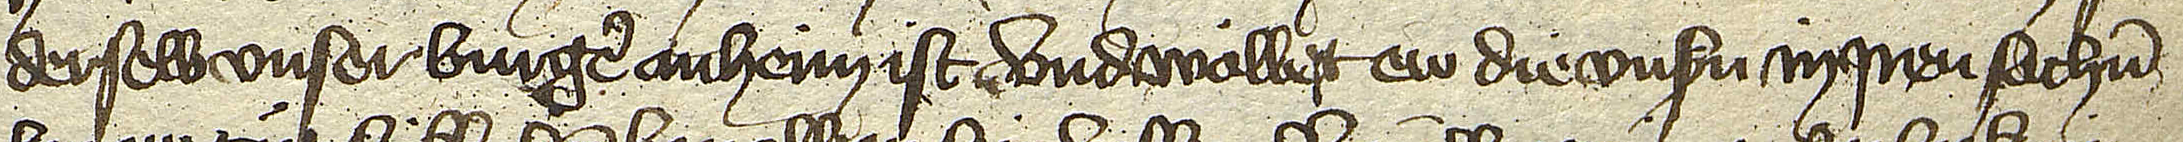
derſelb vnſer burge* anheim iſt / vnd wöllet ew die vnſ*n in Iren ſachn*
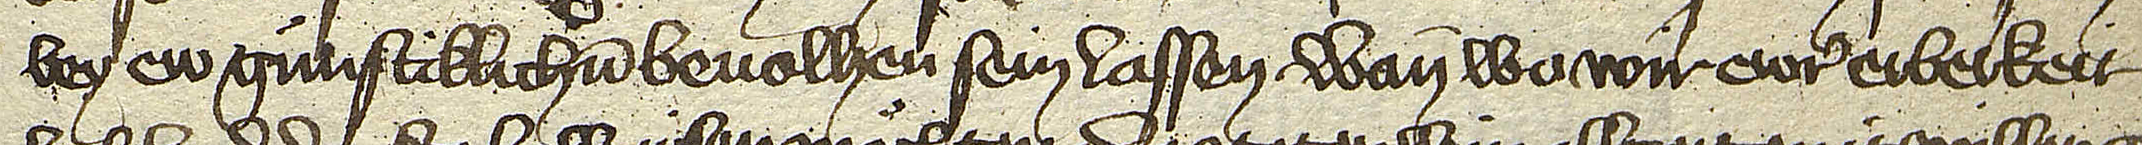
bey ew günſtiklichn* beuolhen ſein laſſen / wan* wo wir ewr* erberkeit
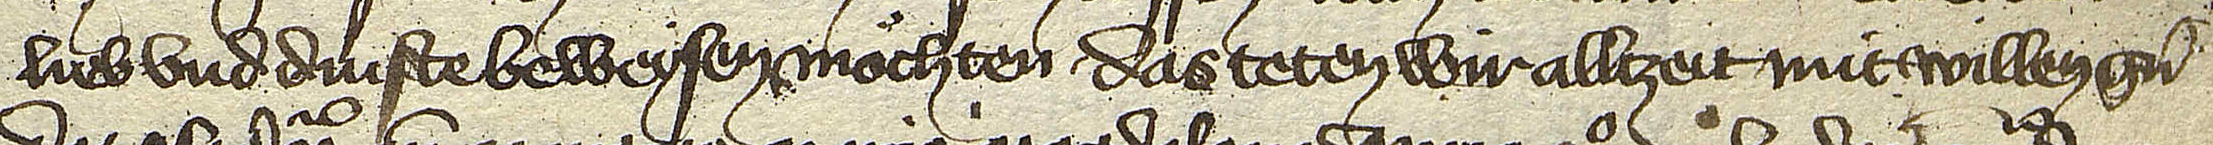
lieb vnd dinſte beweiſen möchten / das teten wir allcʒeit mit willen gn*
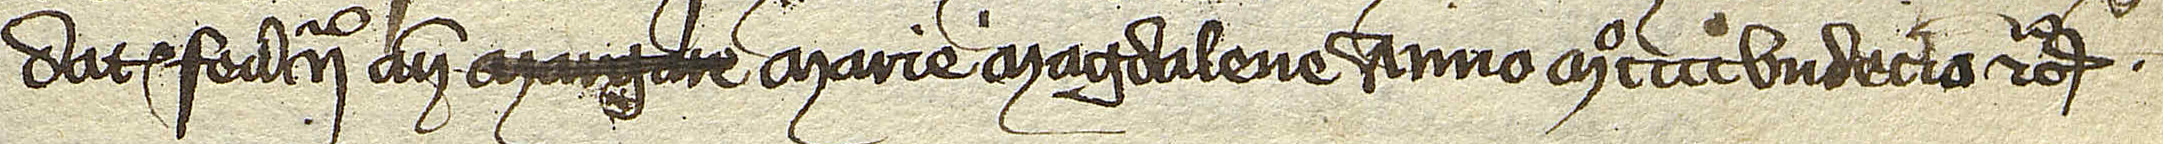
dat* fea* ii* Margare Marie Magdalene Anno M*cccc vndecio* ec* § .
